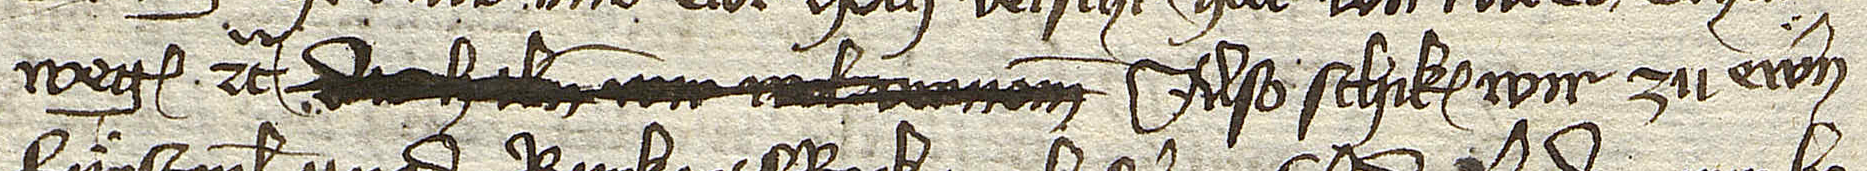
weg* ec* das habn* wir wol vernom* Alſo ſchik* wir ʒu ew*n
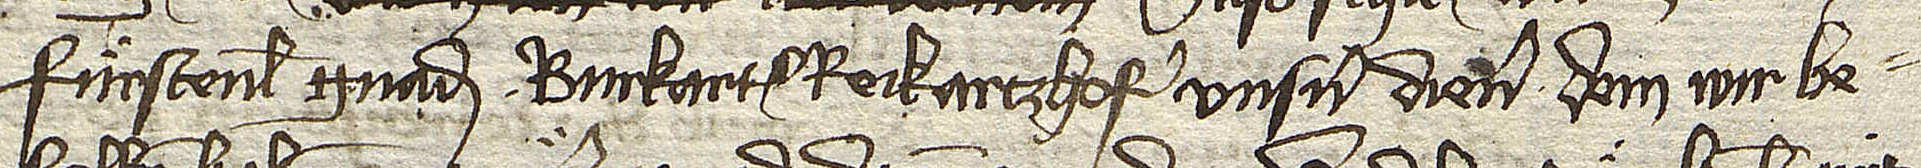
fürſtenl* gnad* . Burkart* Reikarcʒhof* vnſn* dien* dem wir be =
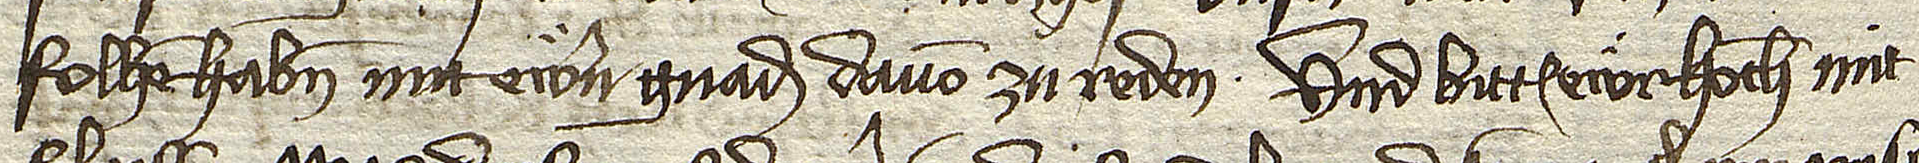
folhe* habn* mit ew*n gnad* dauo* ʒu reden . Vnd bitt* ewr hoch* mit
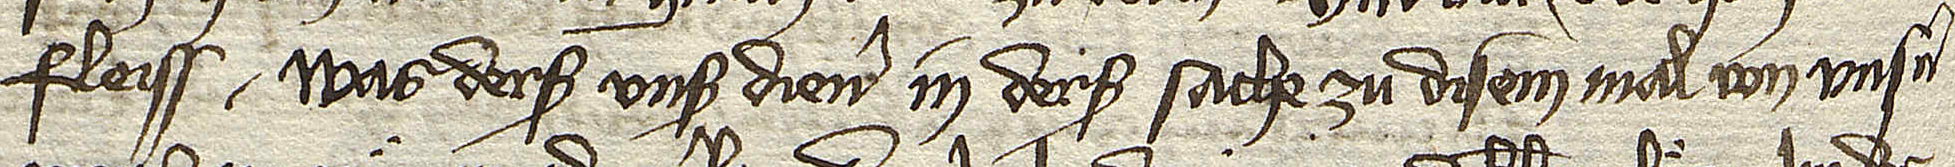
fleiſſ / was derſ* vnſ* dien* in derſ* ſache ʒu diſem mal von vnſn*
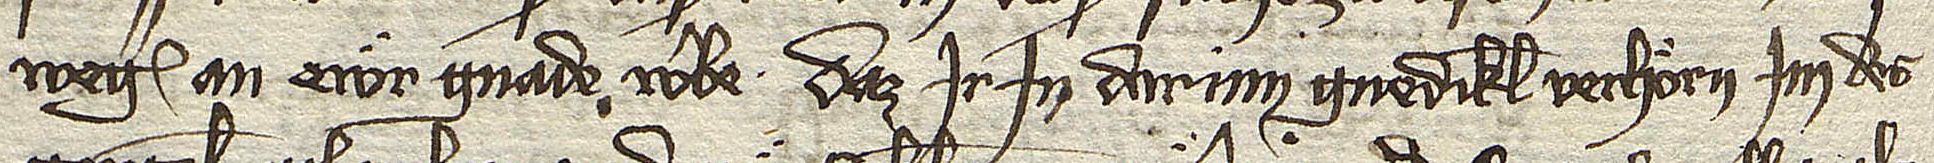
weg* an ewr gnade w*be . Daʒ Ir In darinn gnedikl* verhörn Im des
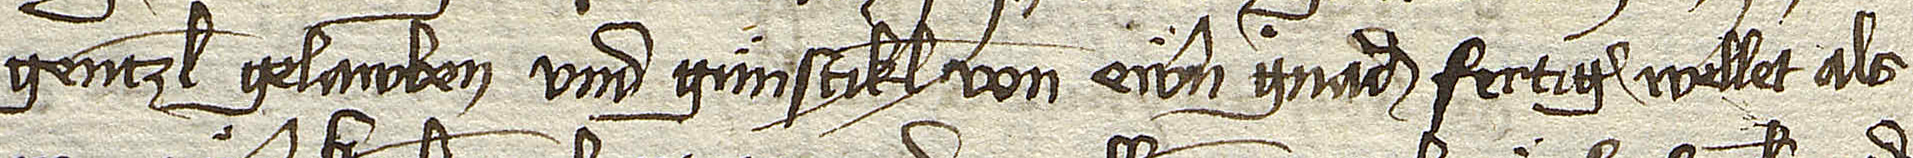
gencʒl* gelawben vnd günſtikl* von ew*n gnad* fertig* wellet als
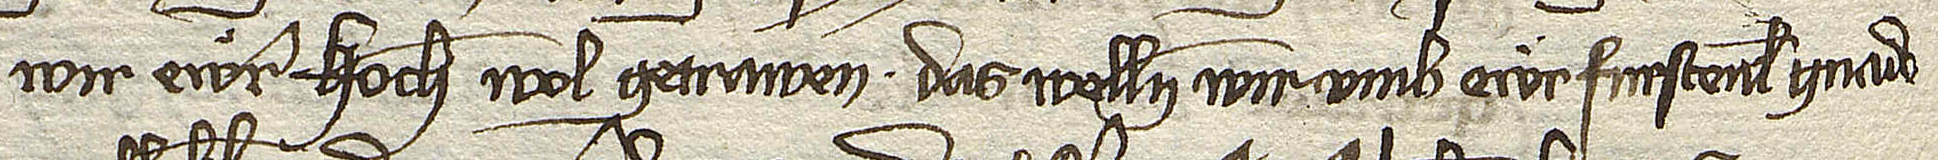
wir ewr Hoch* wol getrawen . das welln* wir vmb ewr furſtenl* gnad*
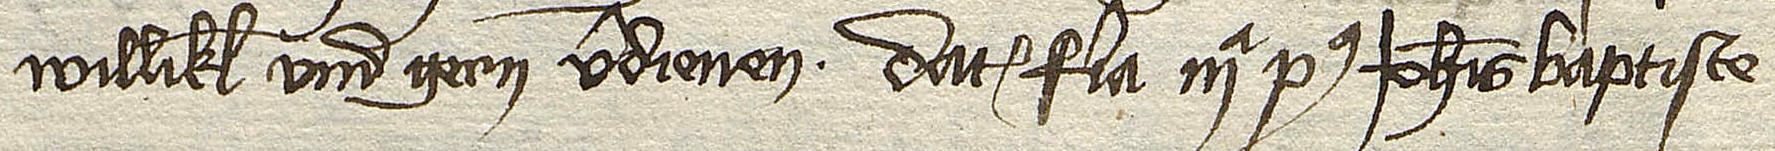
willikl* vnd gern v*dienen . Dat* fi*a iii* p* Iohis* baptiſte
